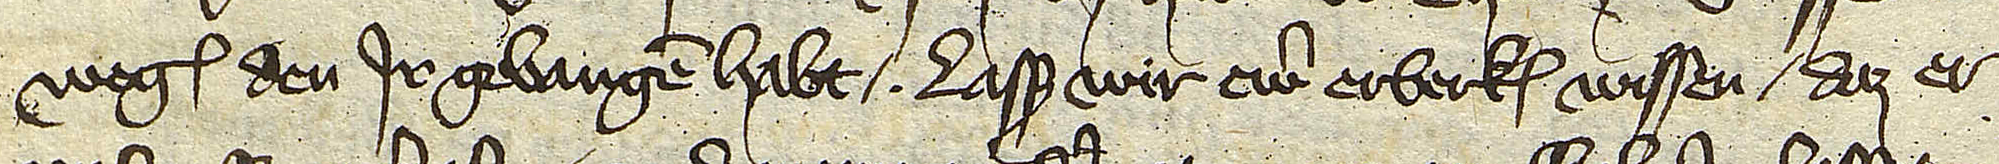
weg* den Ir gevange* habt / . Laſſ* wir ew* erberk* wiſſen / daʒ er
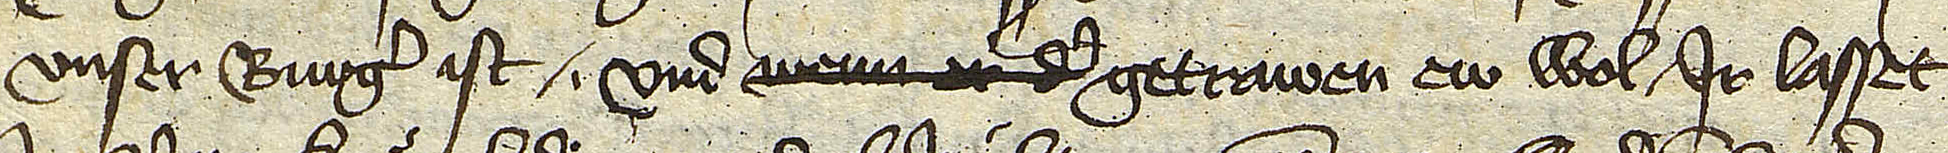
vnſer Burg* iſt / . vnd wenn er d* getrawen ew wol / Ir laſſet
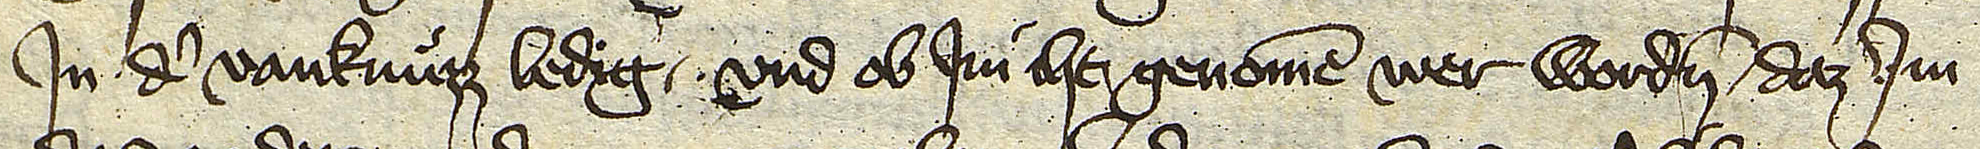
In d* vanknüʒʒ ledig / vnd ob Im iht genome* wer wordn* / daʒ Im
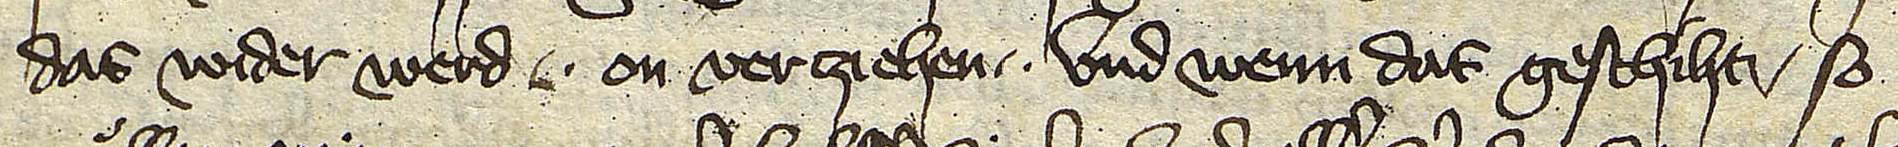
das wider werd / . on vercʒiehen / . vnd wenn das geſchiht / ſo
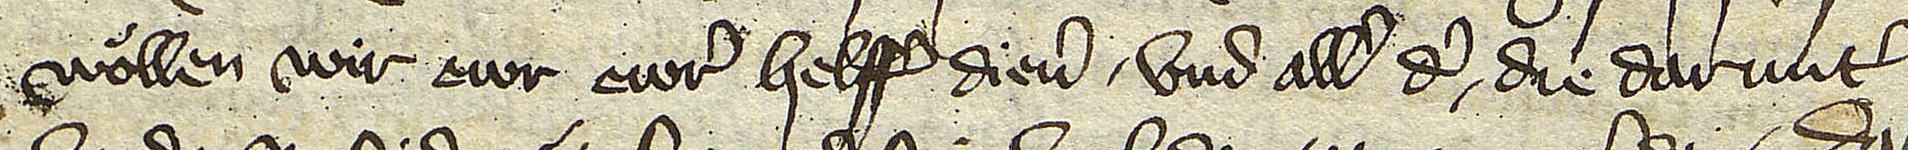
wöllen wir ewr ewr* helff* dien* / vnd all* d* / die darunt*
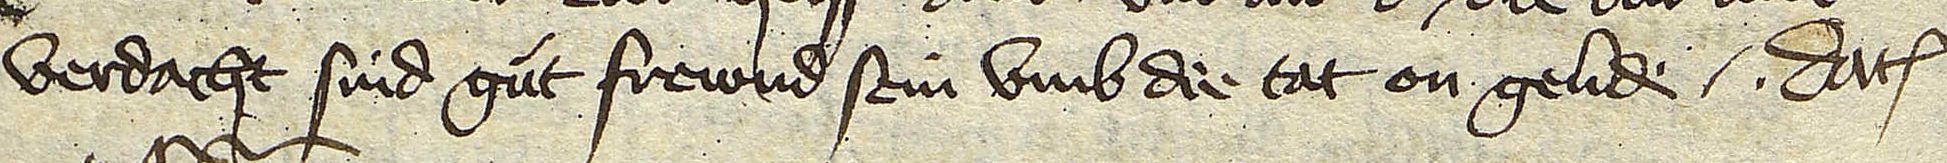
verdacht ſind gut frewnd ſein vmb die tat on geu*de / . Dat*
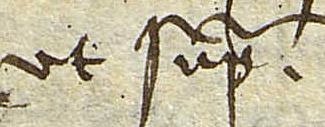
vt ſup .
